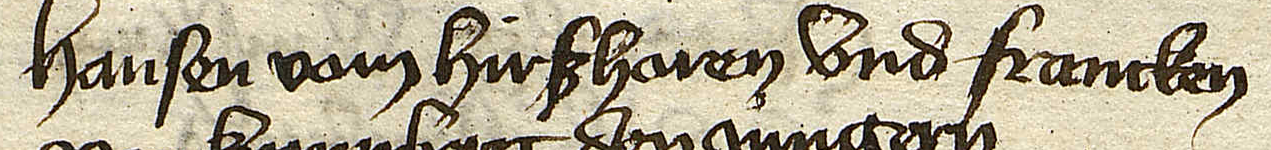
Hanſen vom hirſ*horen Vnd francken
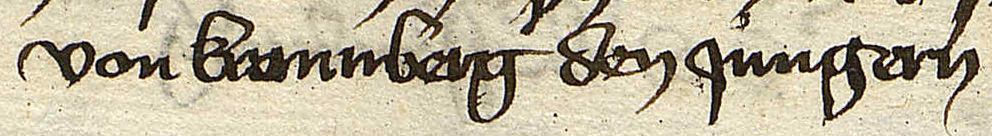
von krannberg den Iüngern
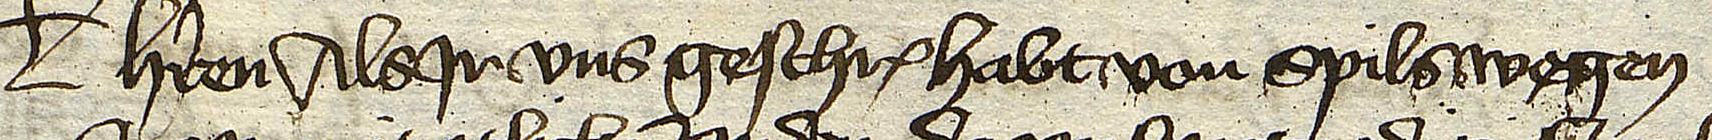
L* h*ren Als Ir vns geſchr* habt von Spils wegen
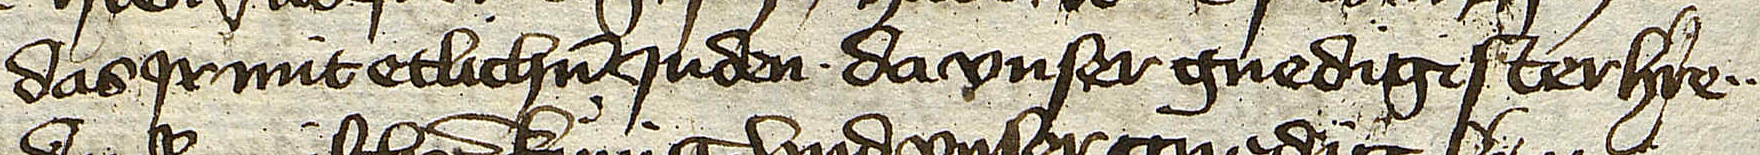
das Ir mit etlich*n Iuden . da vnſer gnedigiſter h*re ~
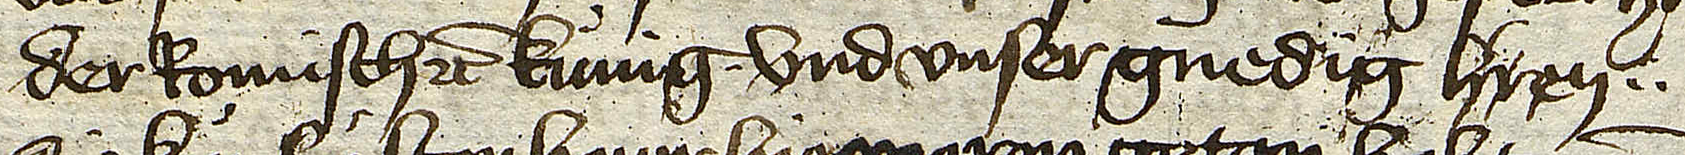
der Romiſch ec* künig . vnd vnſer gnedig h*ren ~
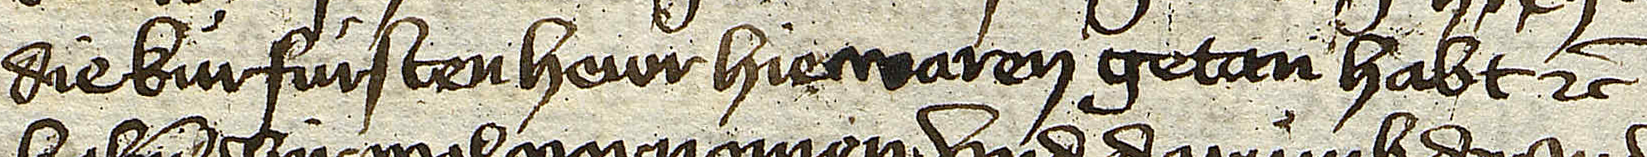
die kürfürſten hewr hie waren getan habt ec*
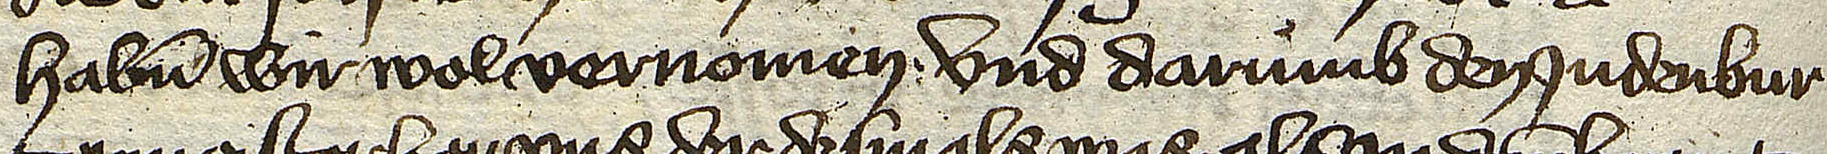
hab*n wir wol vernomen . Vnd darümb den Iudenbur
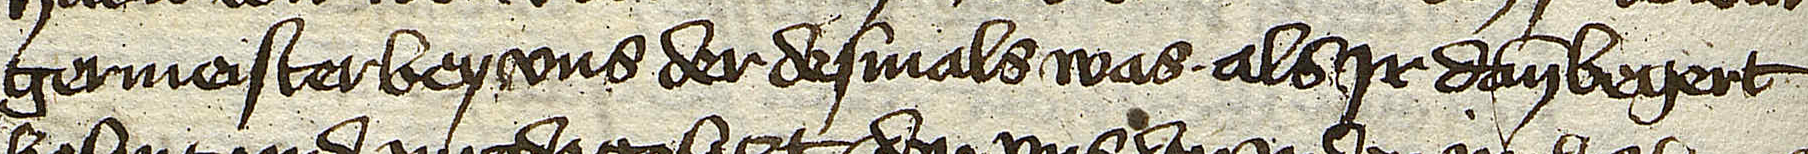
germeiſter bey vns der deſmals was als Ir dan* begert
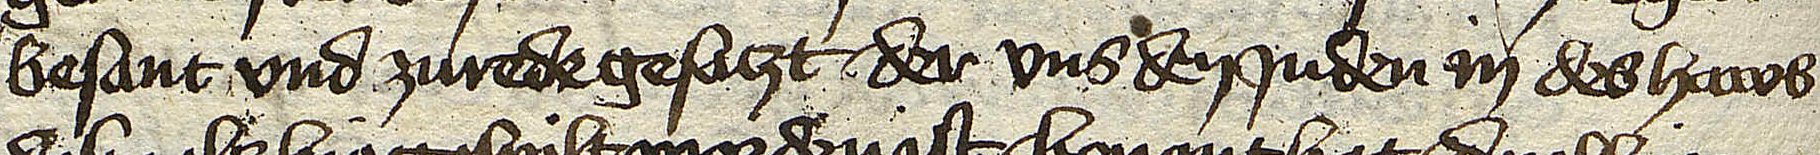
beſant vnd ʒurede geſacʒt / der vns den Iuden in des haws
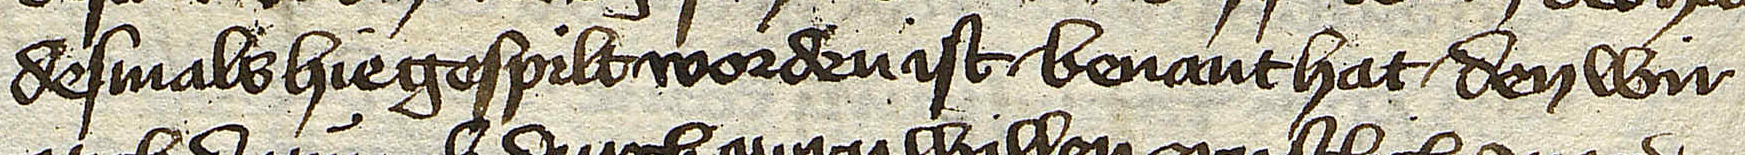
deſmals hie geſpilt worden iſt / benant hat / den wir
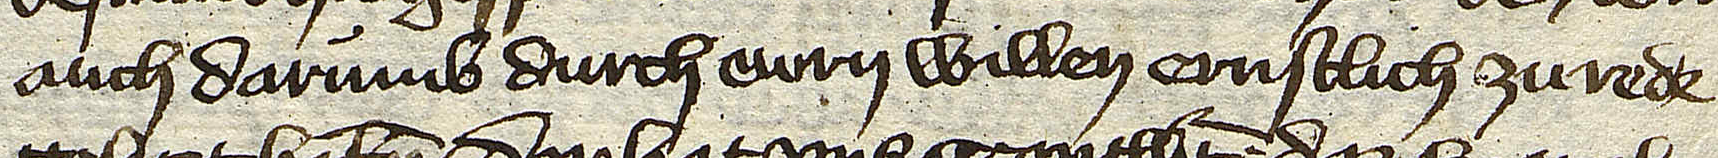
auch darümb durch ewrn willen ernſtlich cʒu rede
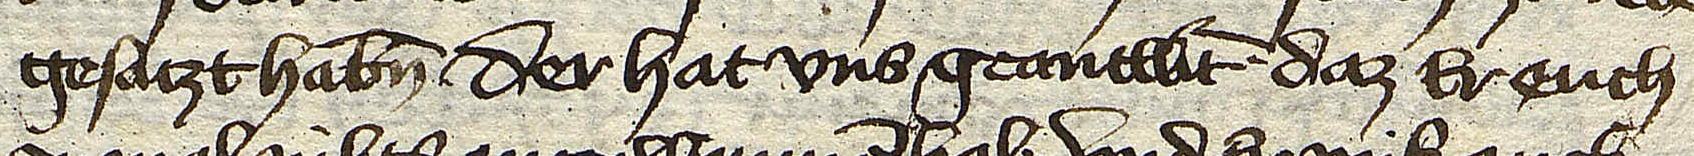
geſacʒt hab*n / Der hat vns geantw*t . daʒ Er euch
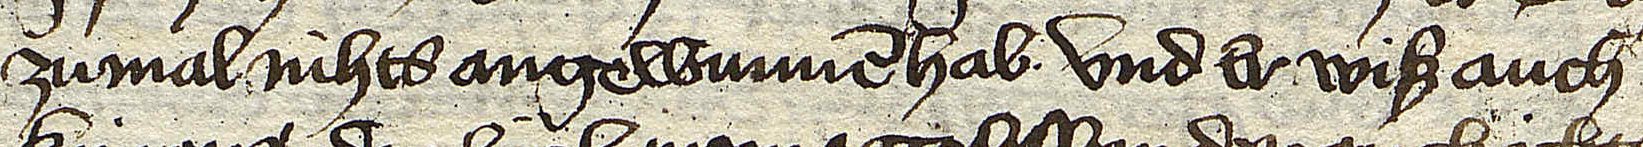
cʒumal nihts angewunne* hab . Vnd Er wiſʒ auch
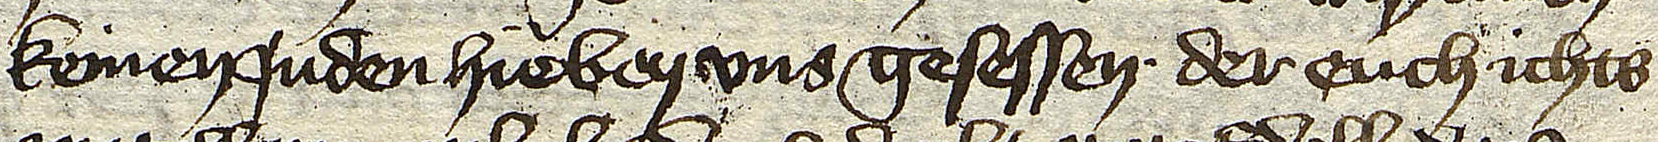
keinen Iuden hie bey vns geſeſſen . der euch ichts
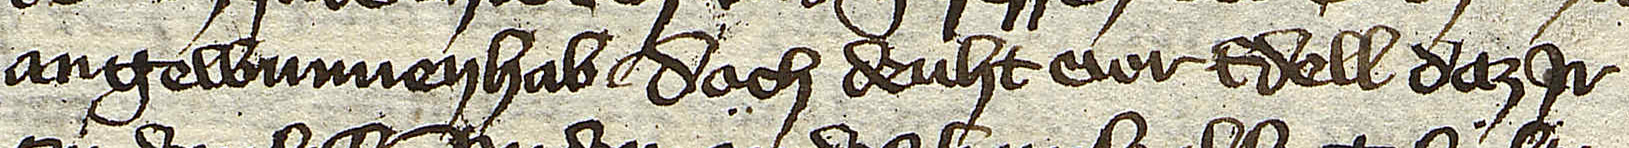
angewunnen hab / Doch deuht ewr Edell daʒ Ir
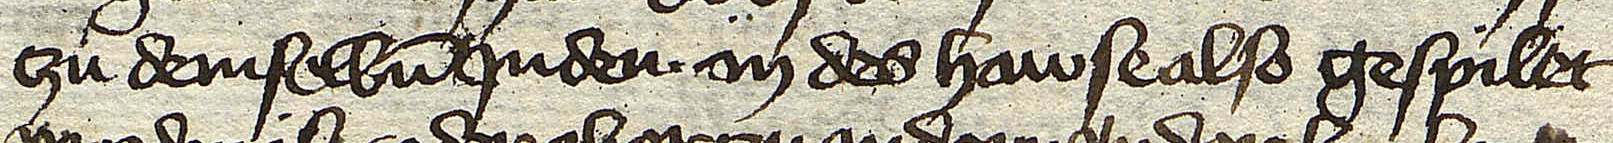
cʒu demſelb*n Iuden . in des hawſe alſo geſpilet
